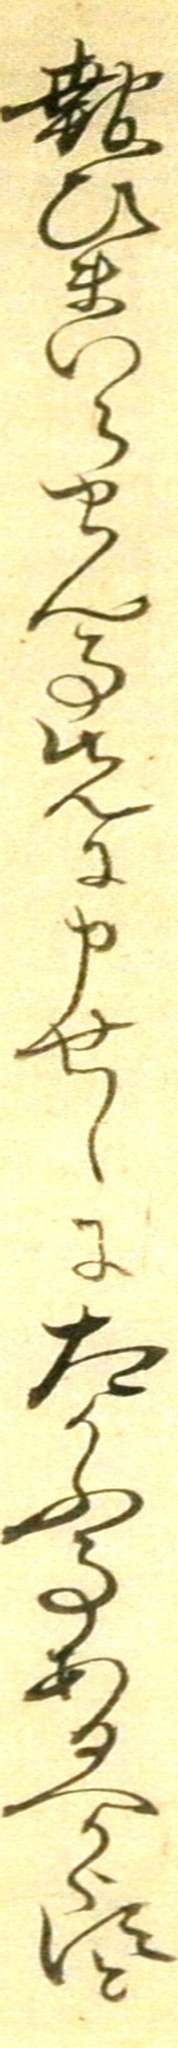報ひまいらせん事先に申せしにたかふ事あるへからすと
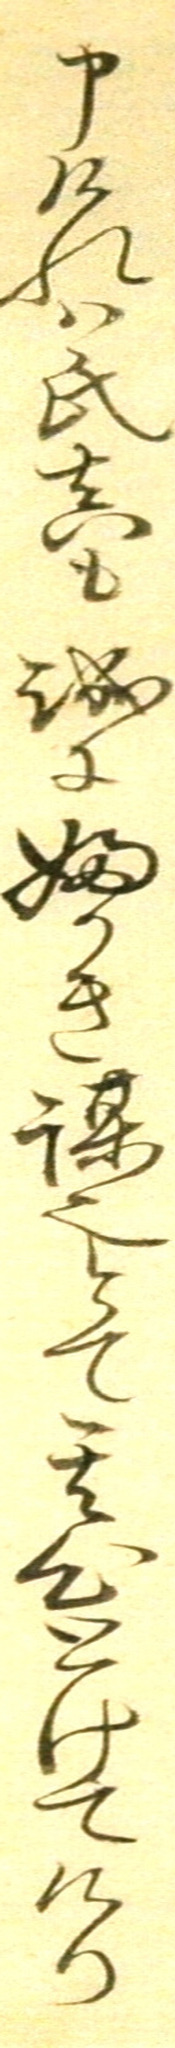申けれは氏真も誠にふかき謀也とて其心とけてけり
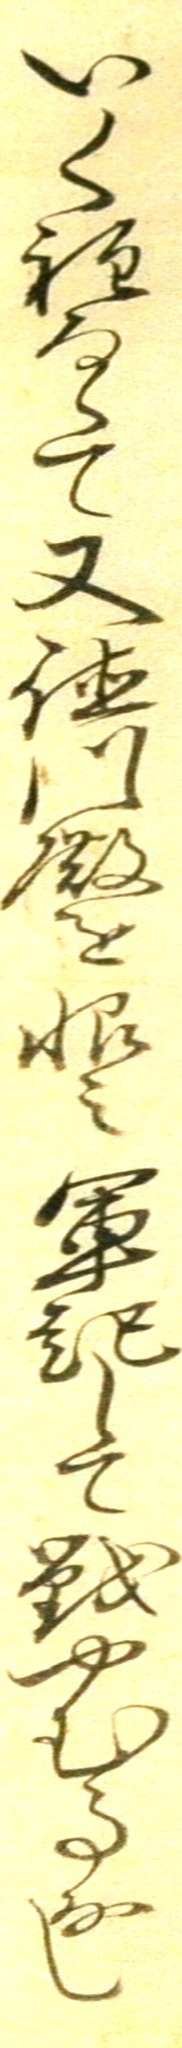いく程なくて又徳川殿を恨み軍起して戦やむ事なし

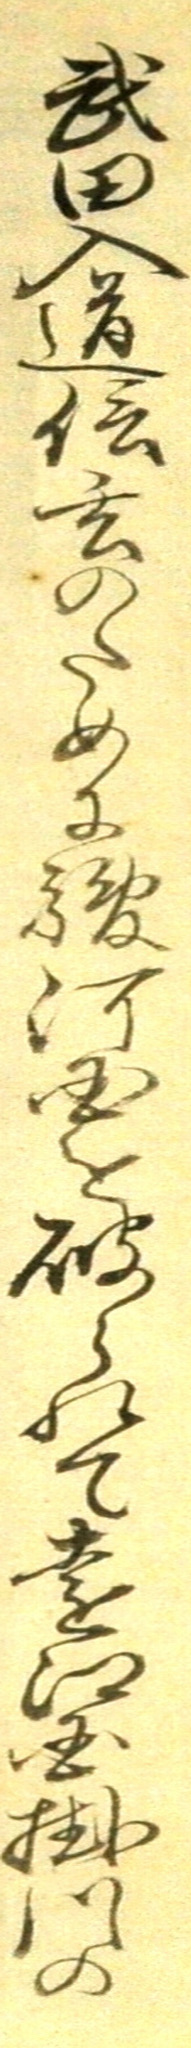武田入道信玄のために駿河国を破られて遠江国掛川の
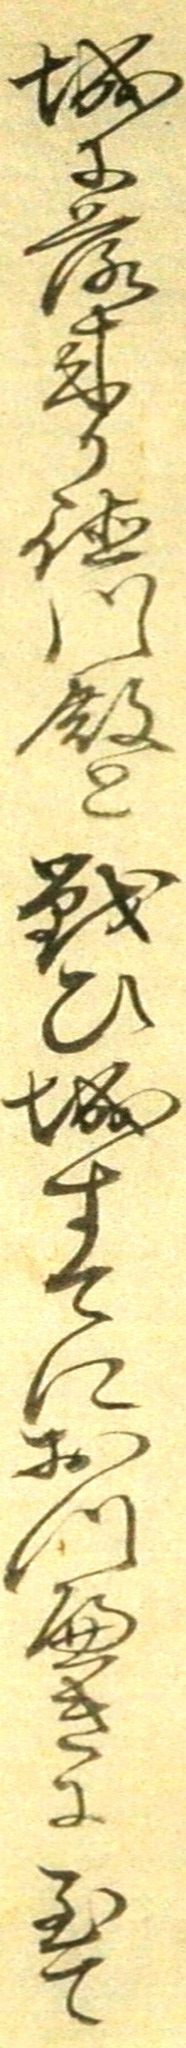城に落来り徳川殿と戦ひ城すてにおつへきに至て
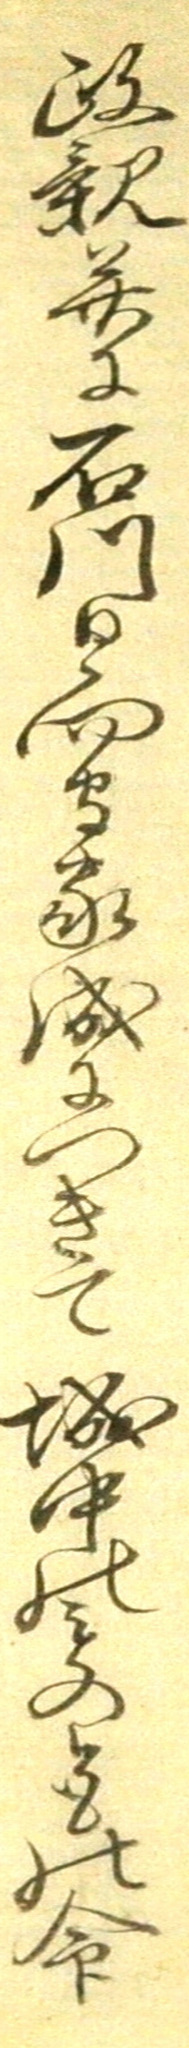政親幷に石川日向守家成につきて城中のものともの命
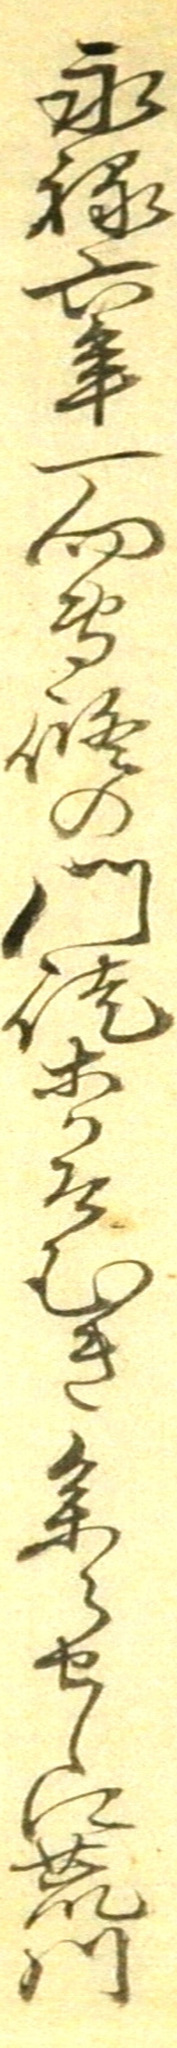永禄六年一向専修の門徒等かそむき参らせしに荒川
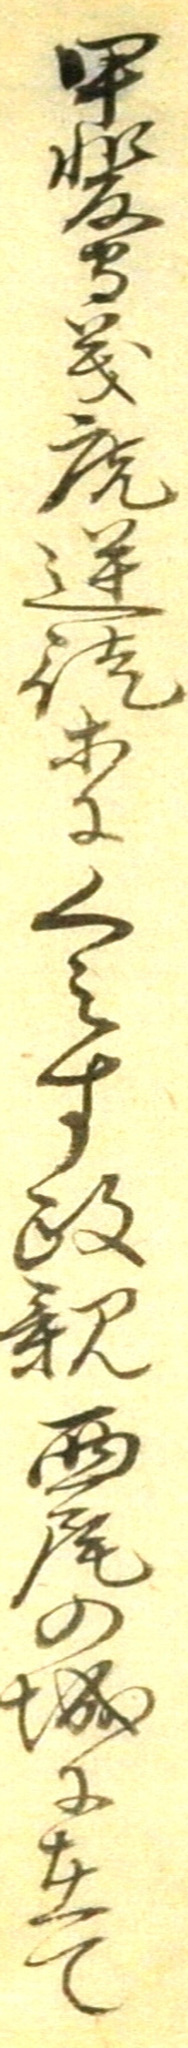甲斐守義広逆徒等にくみす政親西尾の城に在て
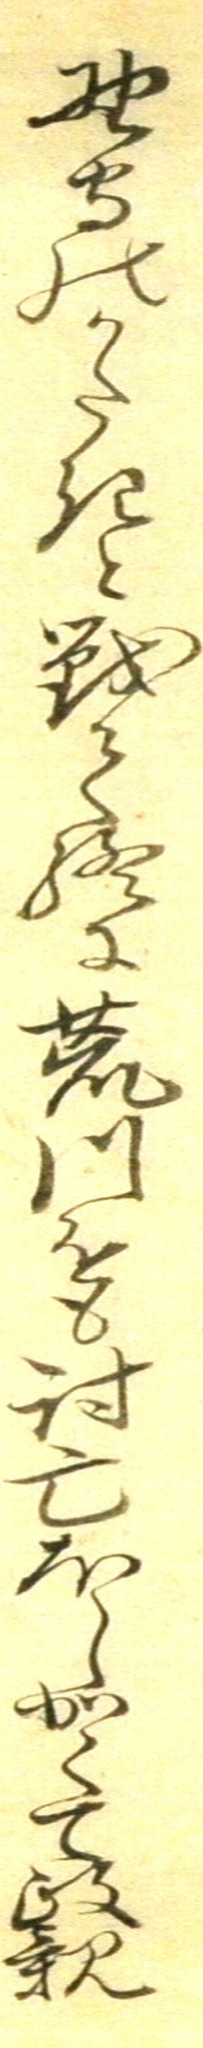野守のかたきと戦て終に荒川をも討亡ほしかくて政親
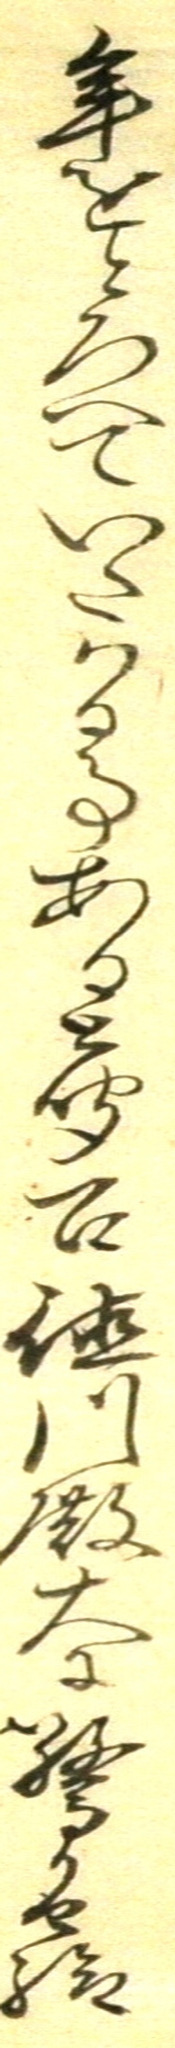年をとろへていたはる事あると聞召徳川殿大に驚かせ給
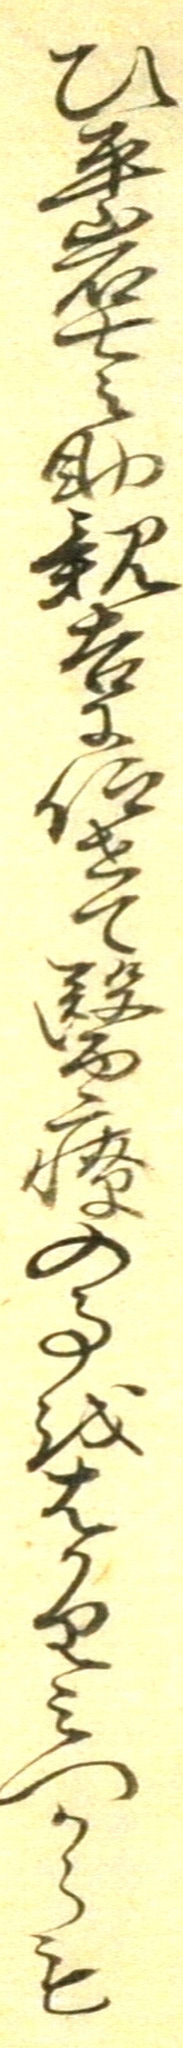ひ平岩七之助親吉に仰せて医療の事をはかりみつからも
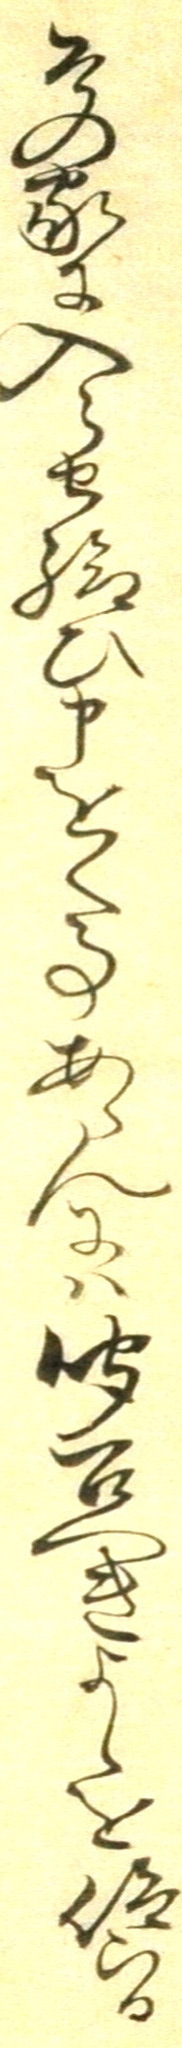その家に入らせ給ひ申をく事あらんには聞召へきよしを仰らる
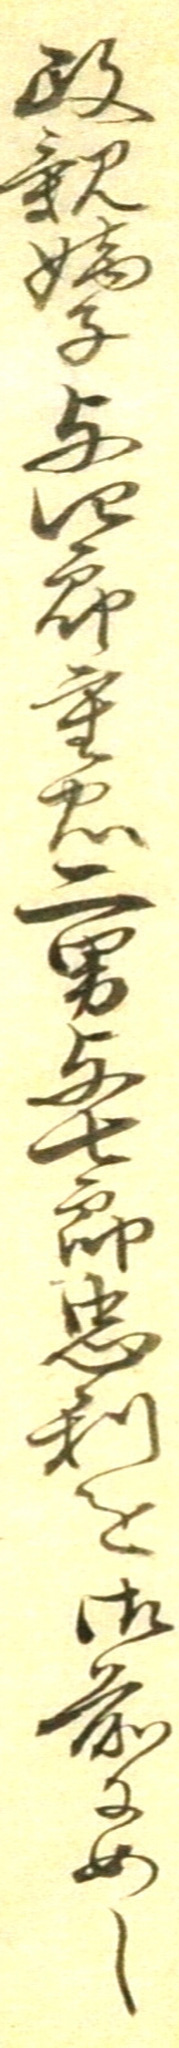政親嫡子与四郎重忠二男与七郎忠利を御前にめし
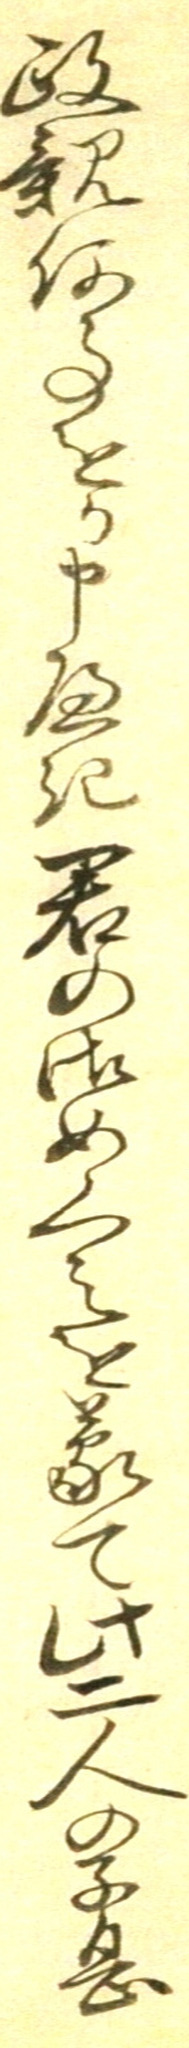政親何事をか申へき君の御めくみを蒙て此二人の子息
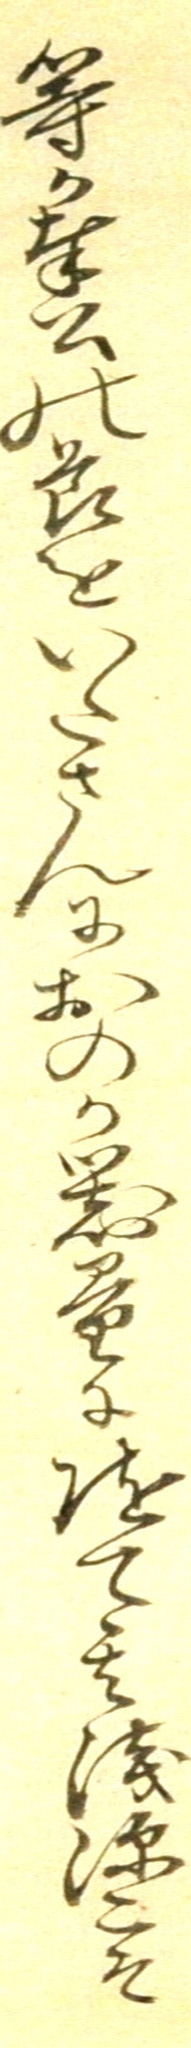等か奉公の節をいたさんにおのか器量に随て其浅深こそ
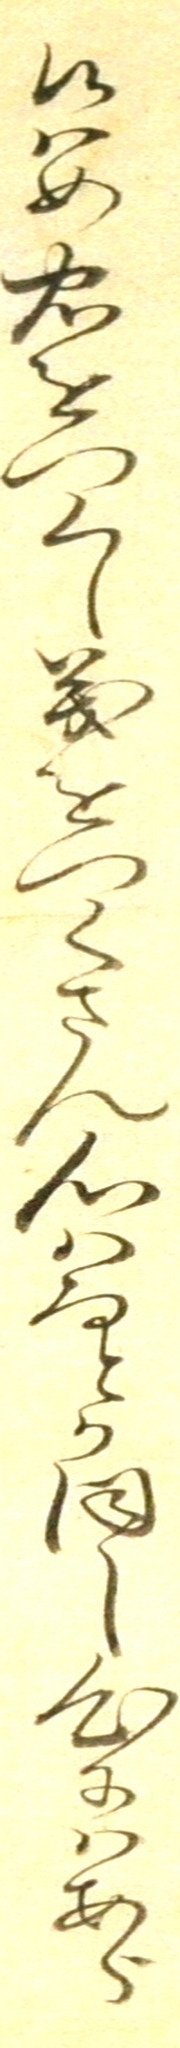候はめ忠をつくし義をつくさん心はなとか同し心にはあら
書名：藩翰譜（五）
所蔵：伊那市立高遠町図書館・合同会社AMANE
